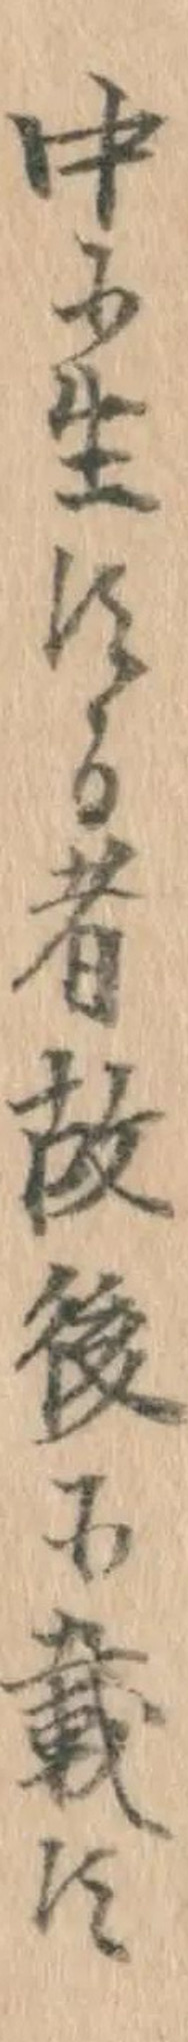中に生する者故後に載す

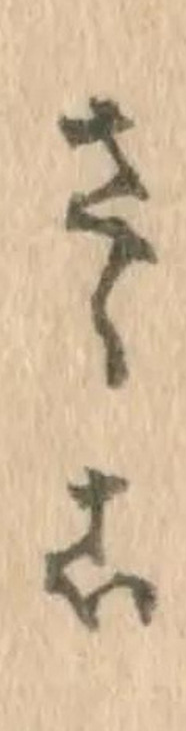さゝこ
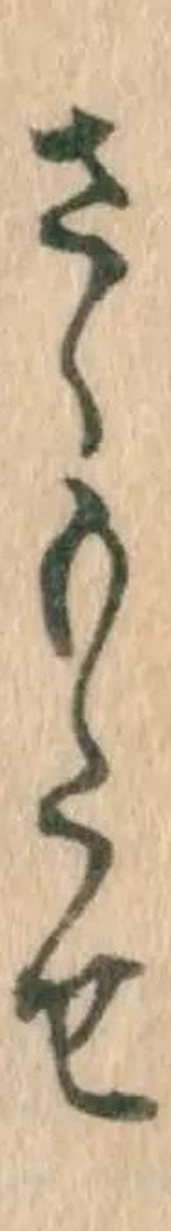さゝもたせ
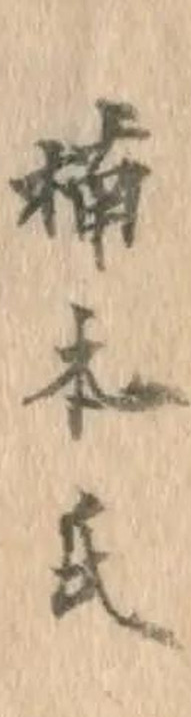楠本氏
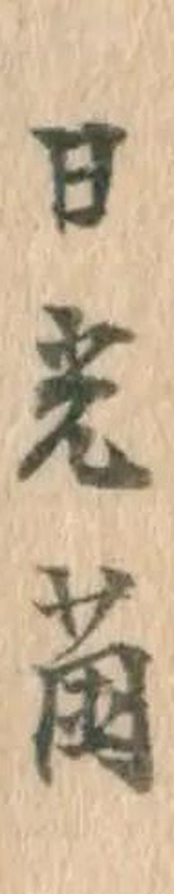日光菌
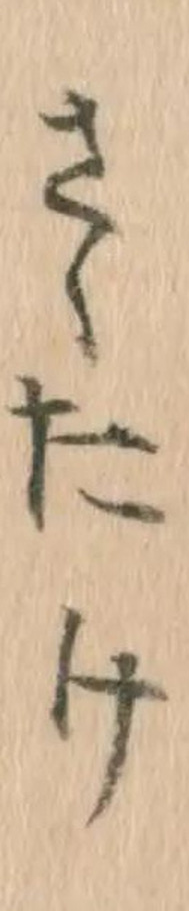さゝたけ
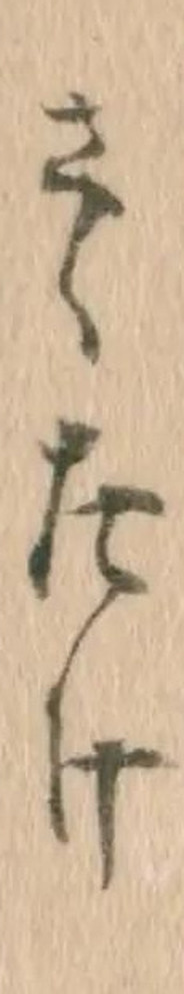さゝたけ
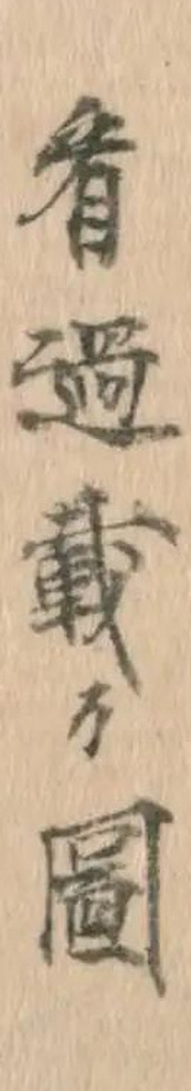看過載る図
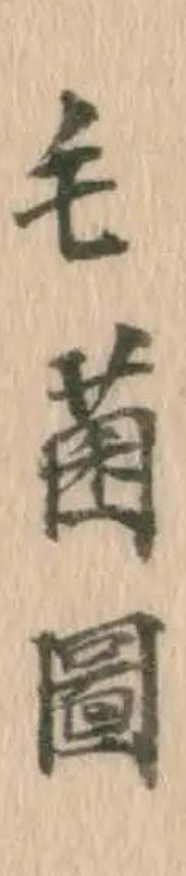毛菌図
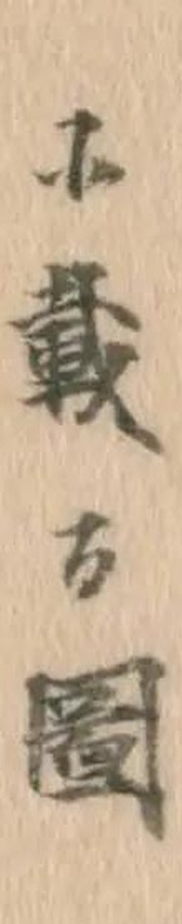に載る図

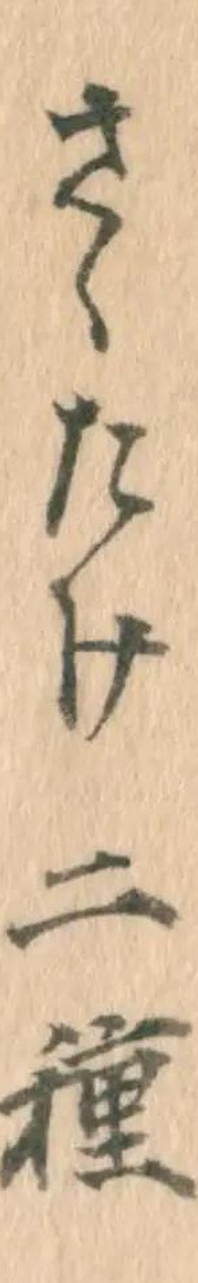さゝたけ二種
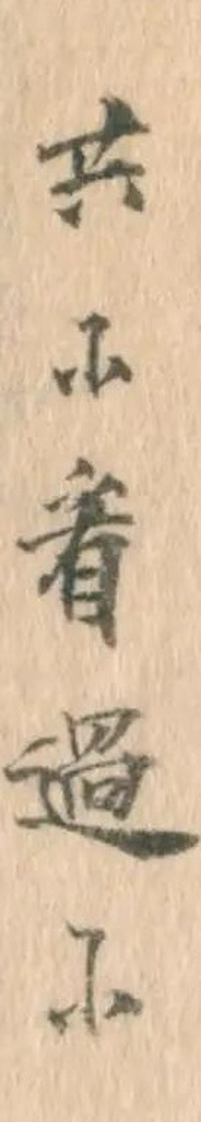共に看過に
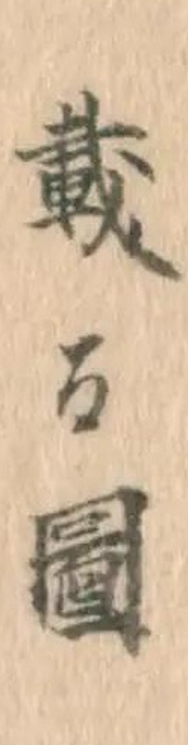載る図
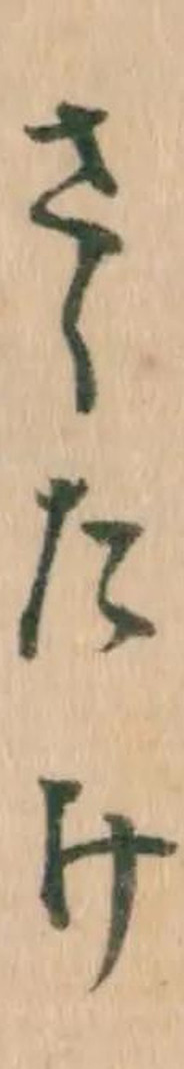さゝたけ
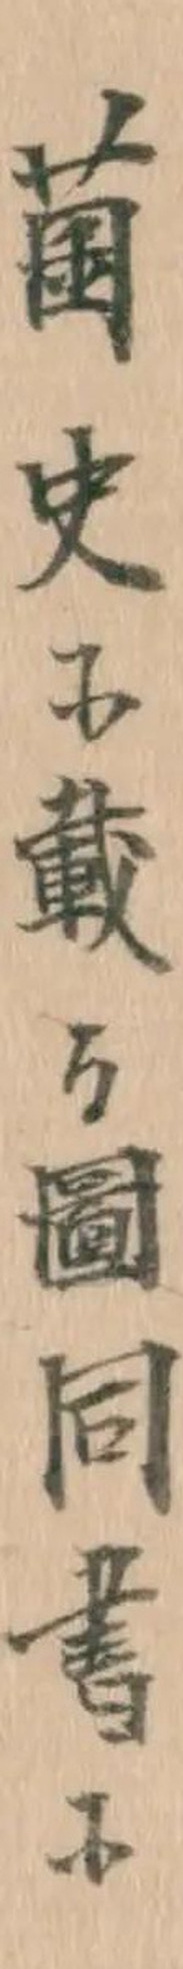菌史に載る図同書に
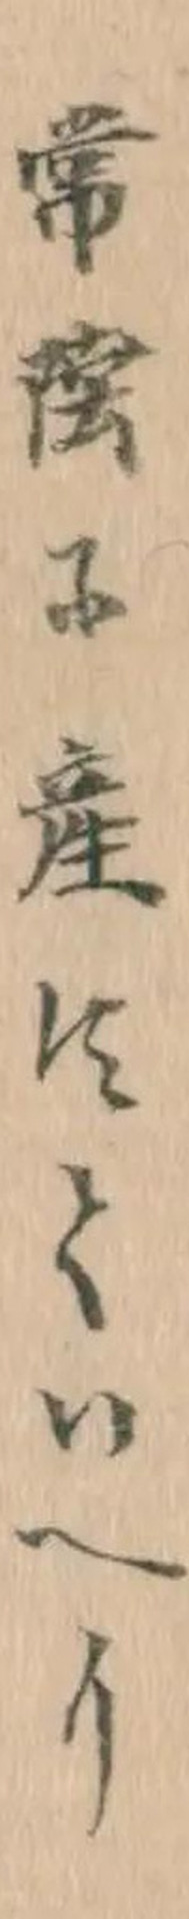常陸に産すといへり
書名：本草図譜. 巻58-60
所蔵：国立国会図書館 National Diet Library, JAPAN
